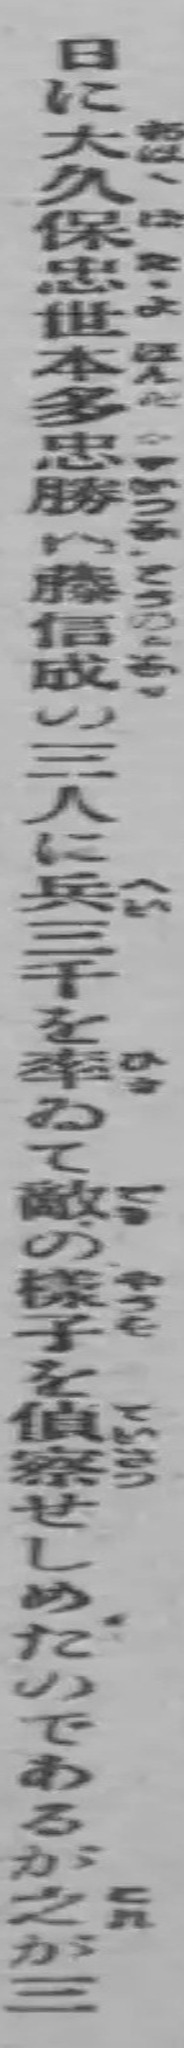日に大久保忠世本多忠勝内藤信成の三人に兵三千を率ゐて敵の様子を偵察せしめたのであるが之が三
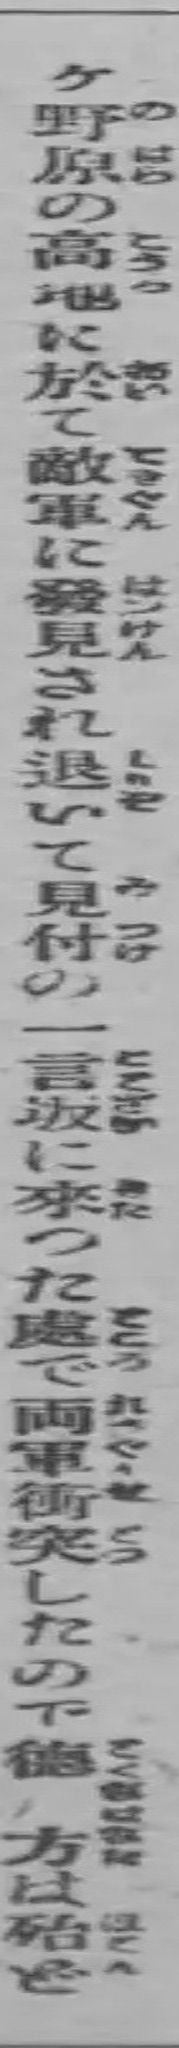一言坂の戦ケ野原の高地に於て敵軍に発見され退いて見付の一言坂に来つた処で両軍衝突したので徳川方は殆ど
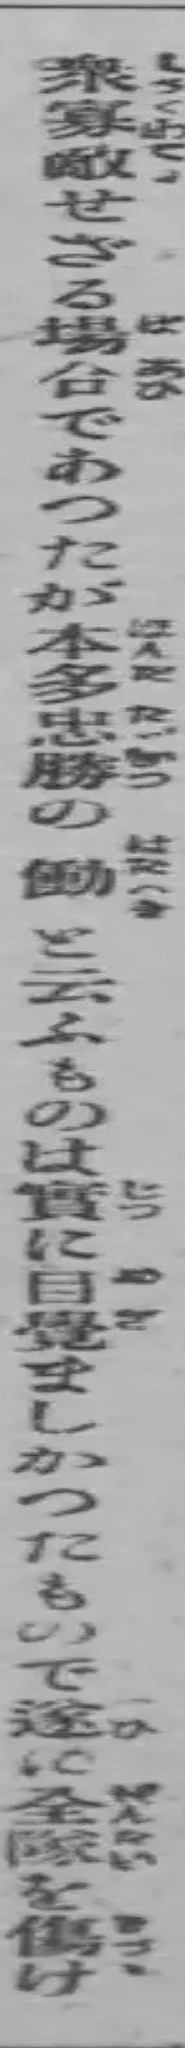衆寡敵せざる場合であつたが本多忠勝の働と云ふものは実に目覚ましかつたもので遂に全隊を傷け
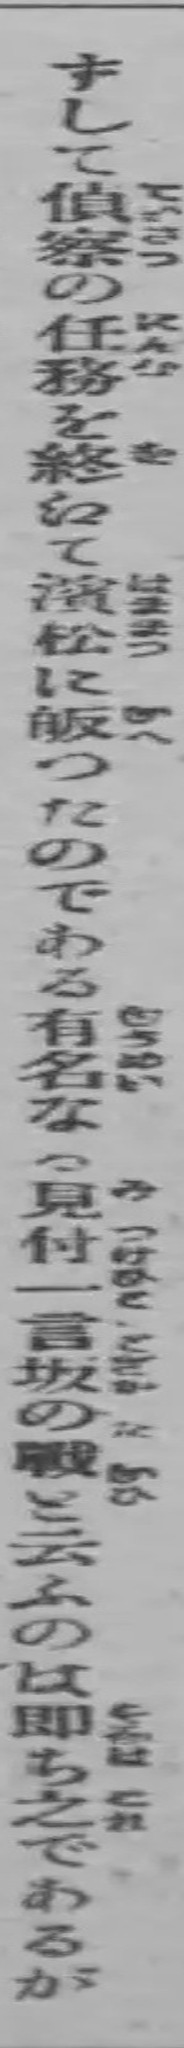ずして偵察の任務を終えて浜松に皈つたのである有名なる見付一言坂の戦と云ふのは即ち之であるが
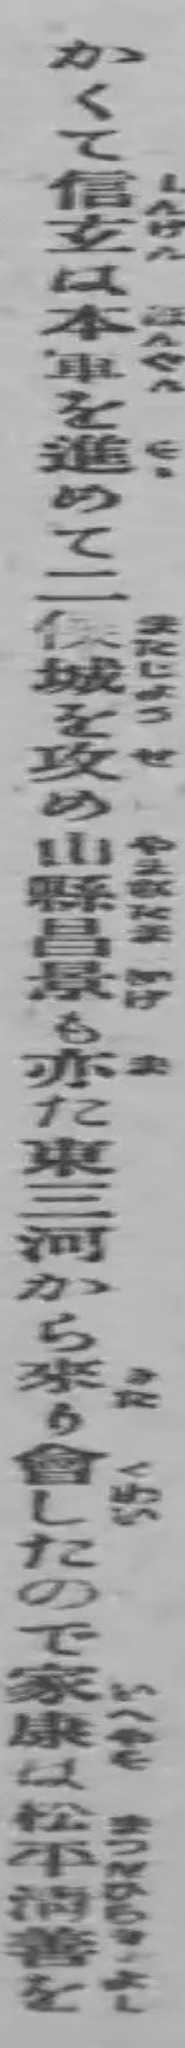かくて信玄は本軍を進めて二俣城を攻め山縣昌景も亦た東三河から来り会したので家康は松平清善を
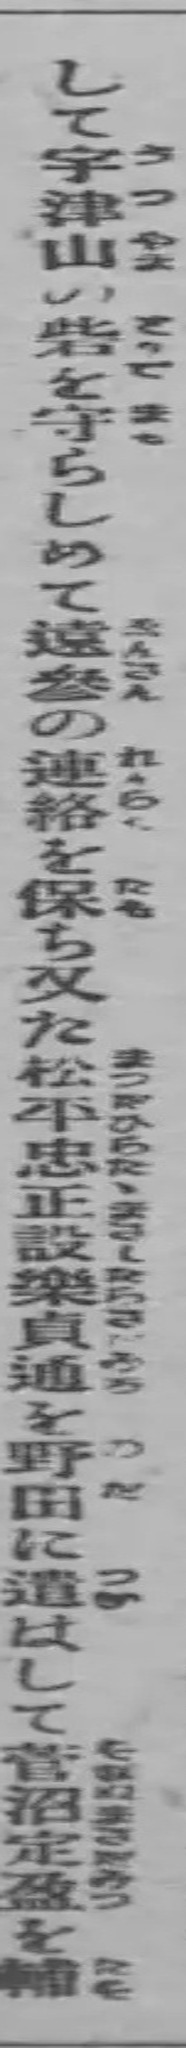して宇津山の砦を守らしめて遠参の連絡を保ち又た松平忠正設楽貞通を野田に遣はして菅沼定盈を輔
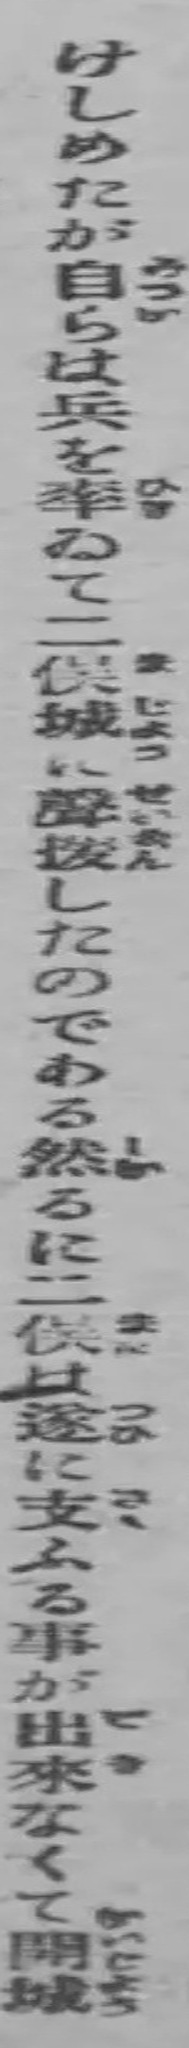けしめたが自らは兵を率ゐて二俣城に声援したのである然るに二俣城は遂に支ふる事が出来なくて開城
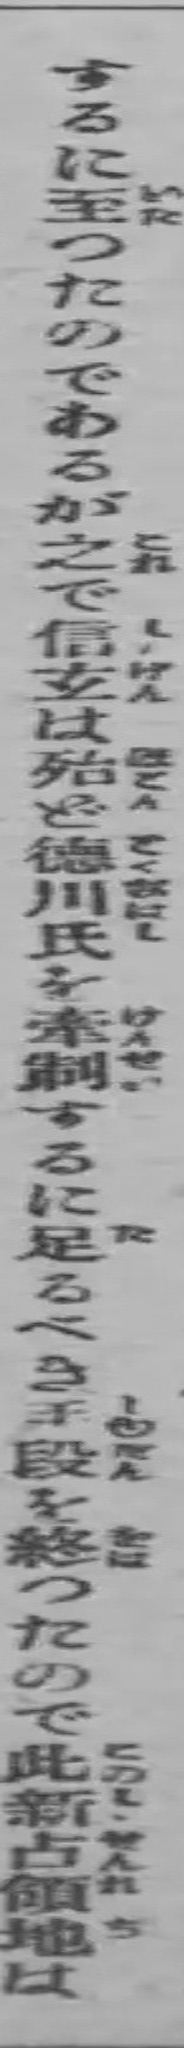するに至つたのであるが之で信玄は殆ど徳川氏を牽制するに足るべき手段を終つたので此新占領地は
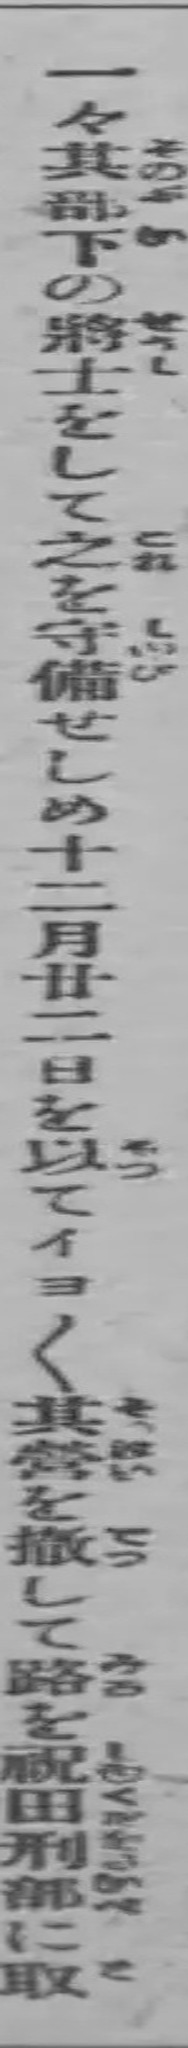一々其部下の将士をして之を守備せしめ十二月廿二日を以てイヨ〳〵其営を撤して路を祝田刑部に取
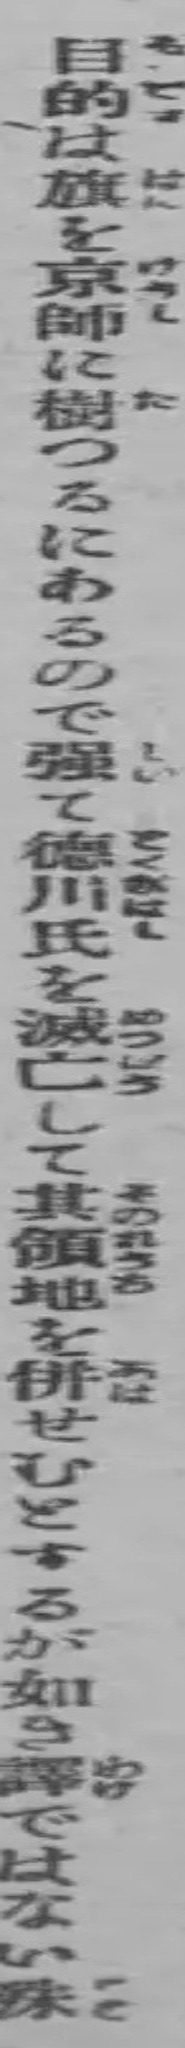す目的は旗を京師に樹つるにあるので強て徳川氏を滅亡して其領地を併せむとするが如き訳ではない殊
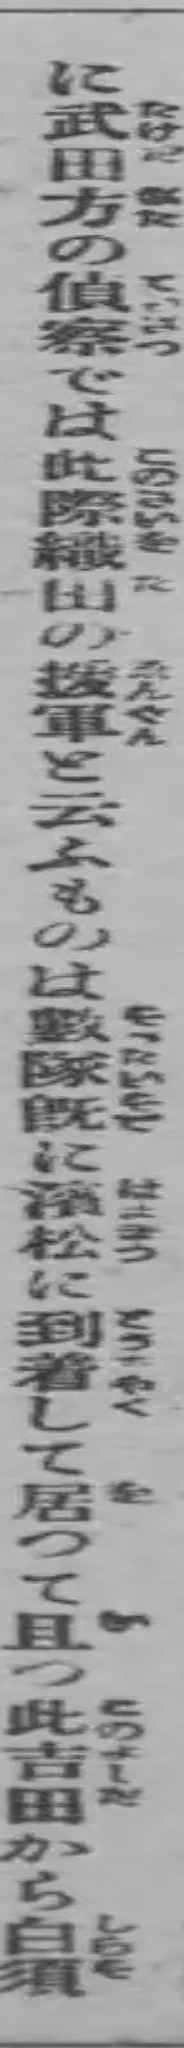に武田方の偵察では此際織田の援軍と云ふものは数隊既に浜松に到着し居つて且つ此吉田から白須
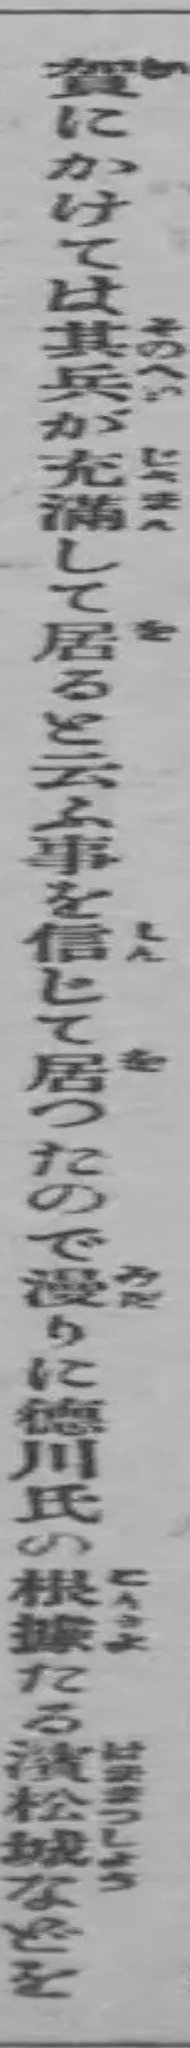賀にかけては其兵が充満して居ると云ふ事を信じて居つたので漫りに徳川氏の根拠たる浜松城などを
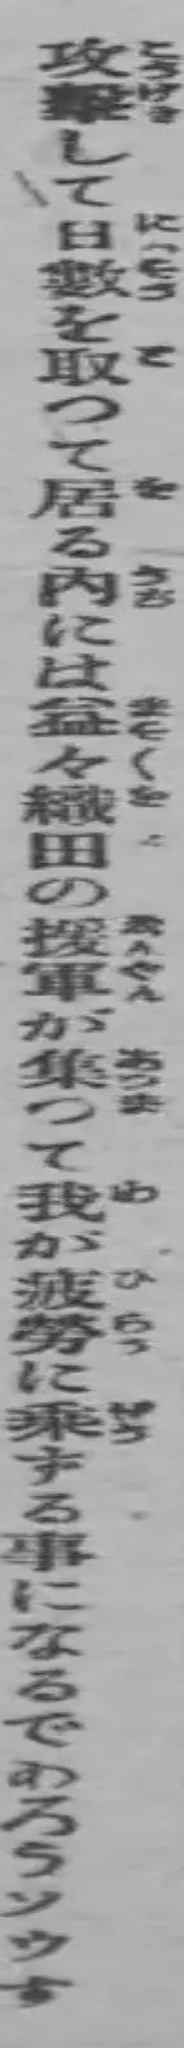攻撃して日数を取つて居る内には益々織田の援軍が集つて我が疲労に乗ずる事になるであろうソウす
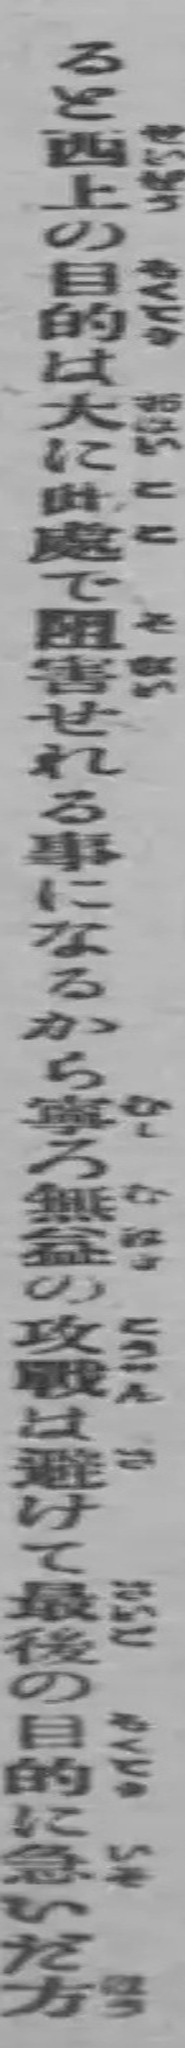ると西上の目的は大に此処で阻害せれる事になるから寧ろ無益の攻戦は避けて最後の目的に急いだ方
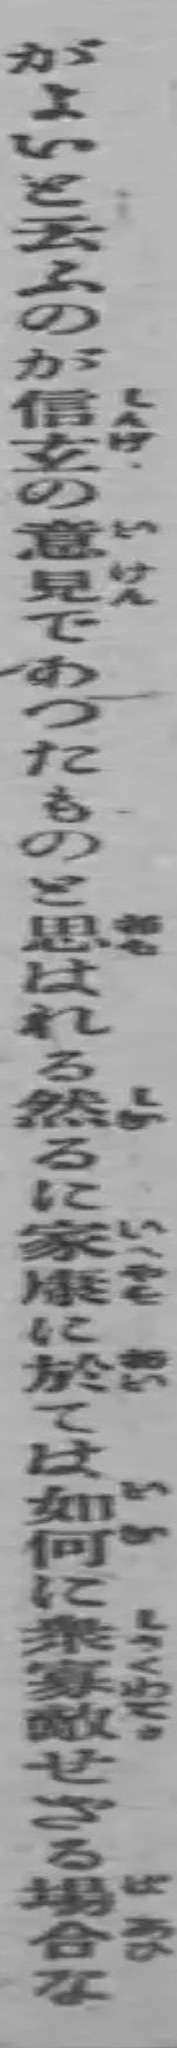がよいと云ふのが信玄の意見であつたものと思はれる然るに家康に於ては如何に衆寡敵せざる場合な
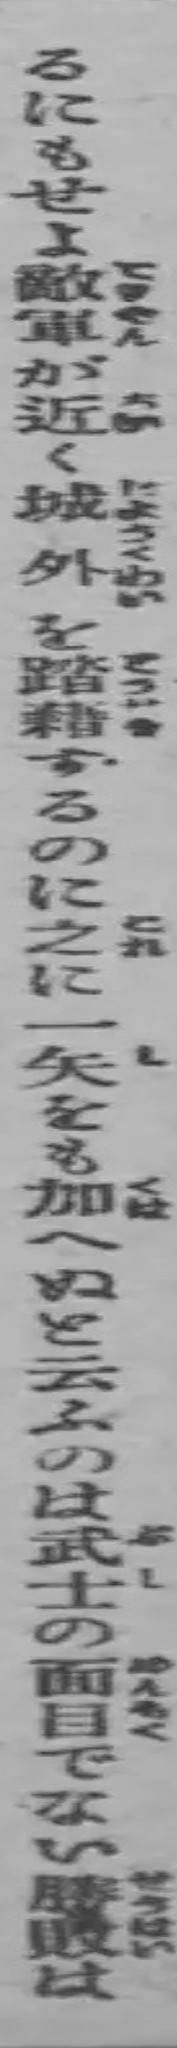るにもせよ敵軍が近く城外を踏藉するのに之に一矢をも加へぬと云ふのは武士の面目でない勝敗は
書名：豊橋市史談
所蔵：国立国会図書館 National Diet Library, JAPAN
